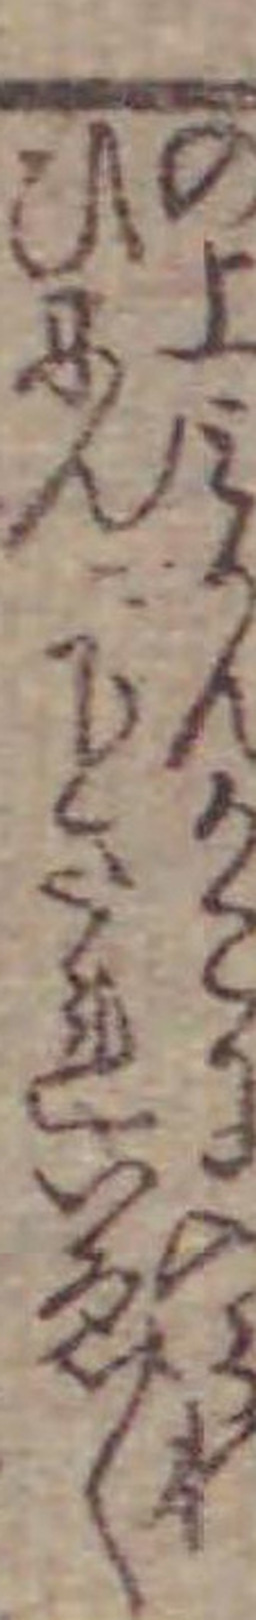ひにんに下されいゑ〳〵
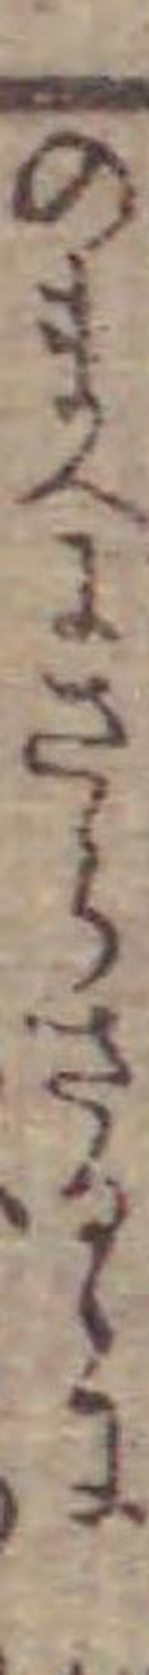のまへにさらさるゝに
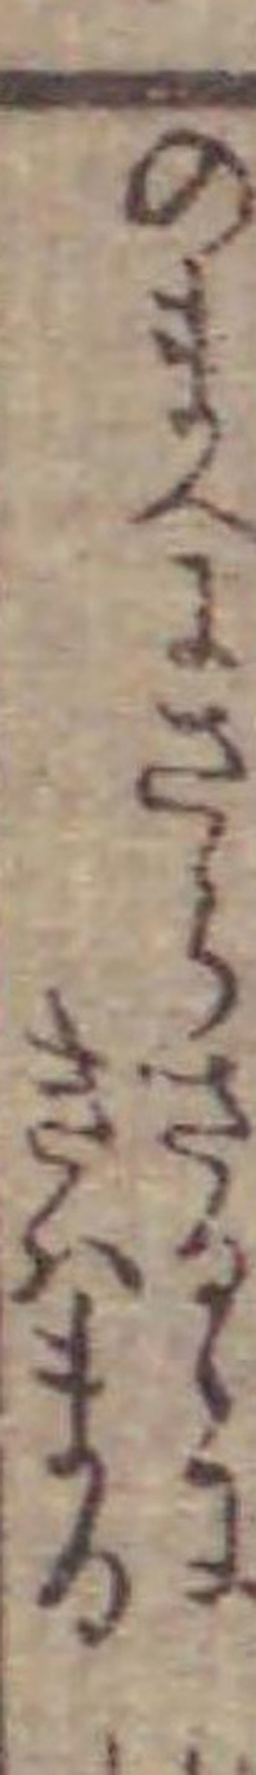きはまる
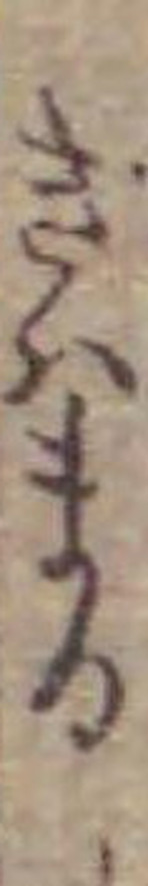きはまる

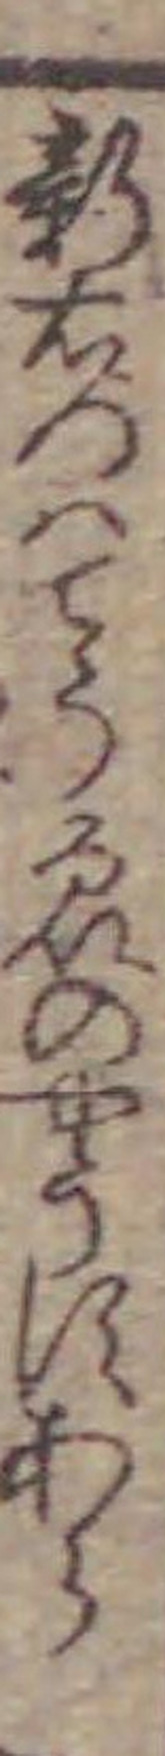新右衛門はてうるいのやうすあら
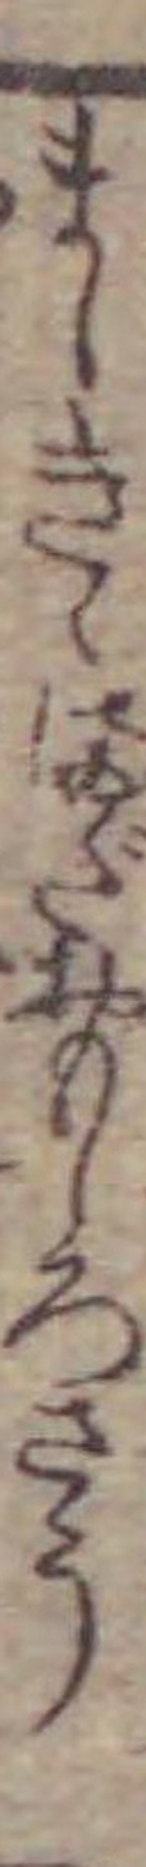ましきゝまだおもしろさう
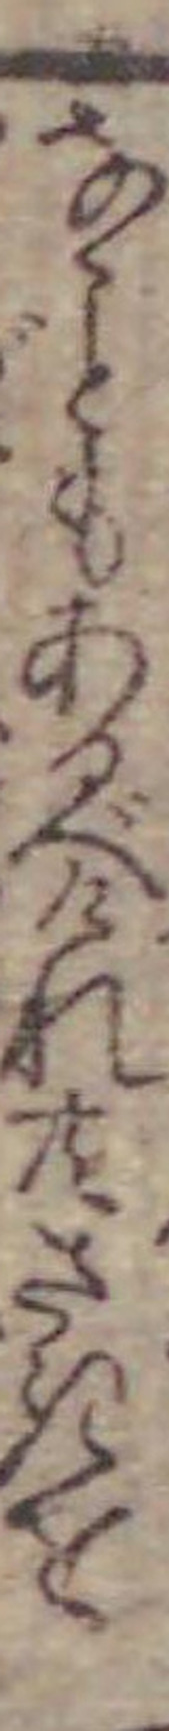なこともあるべけれ共さきを
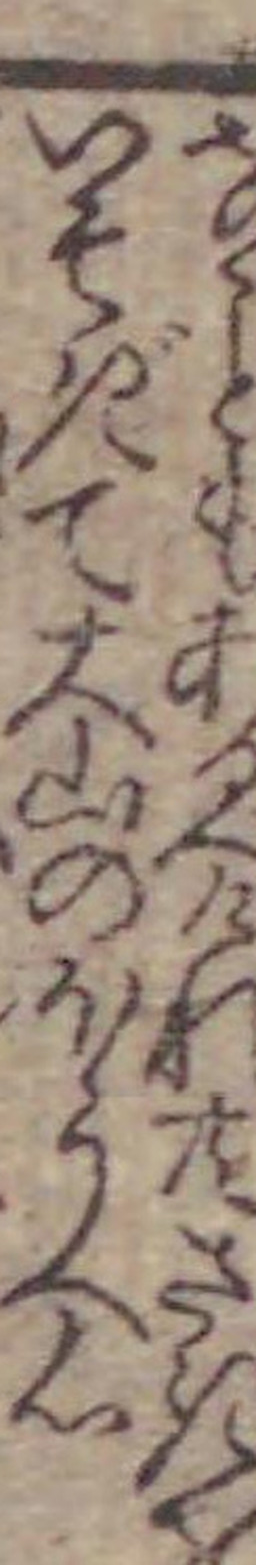いそぎて大山のほうへ心
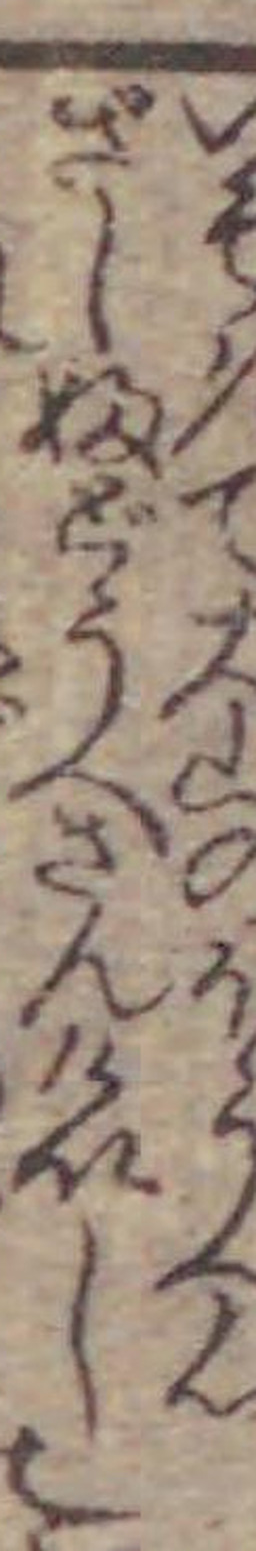ざしふどうへさんけいし
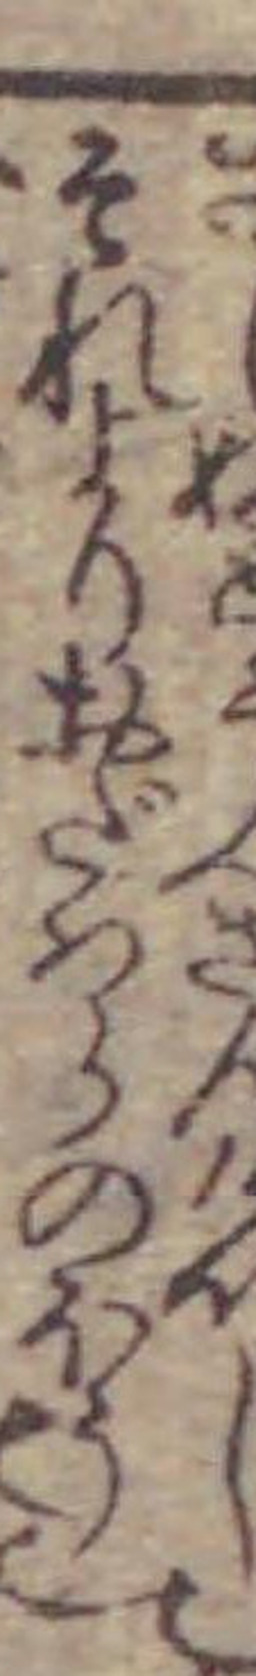それよりおだはらのほう
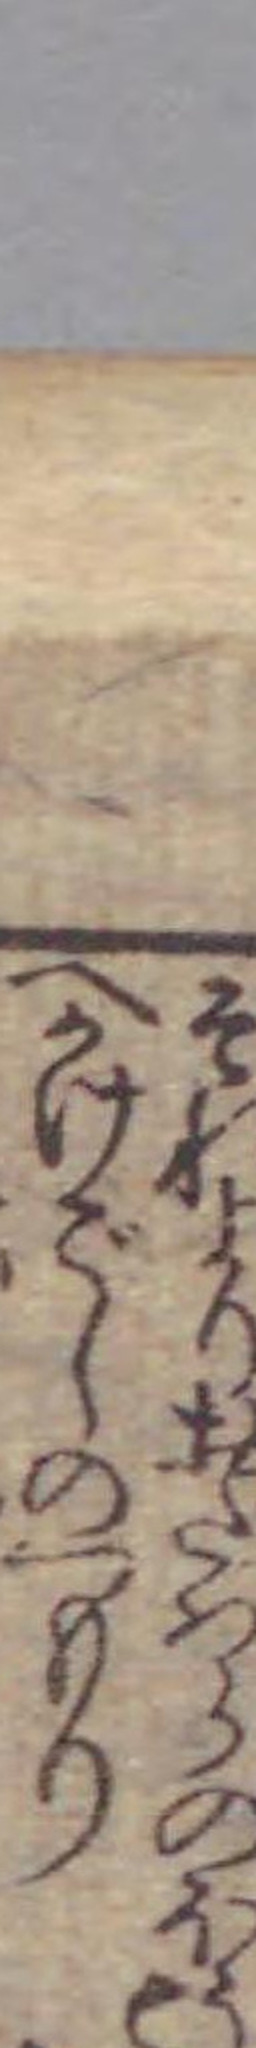へかけごしのつもり
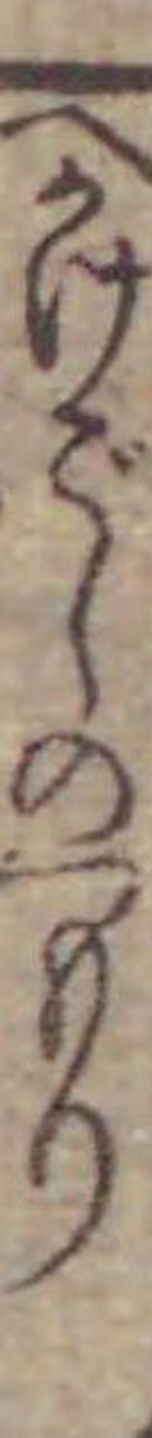へかけごしのつもり
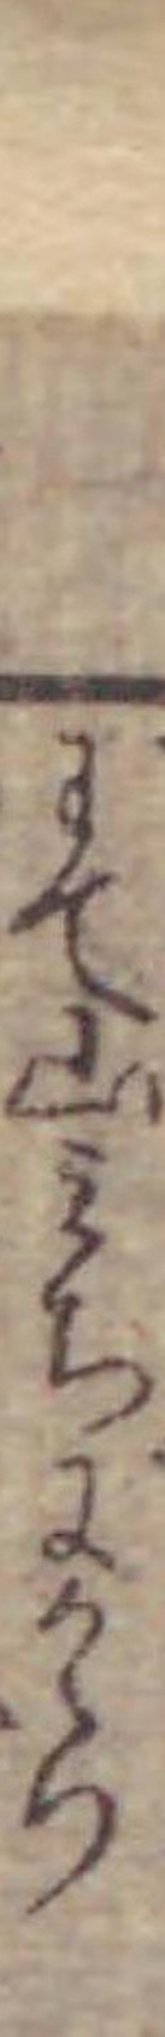にて山みちにかゝり
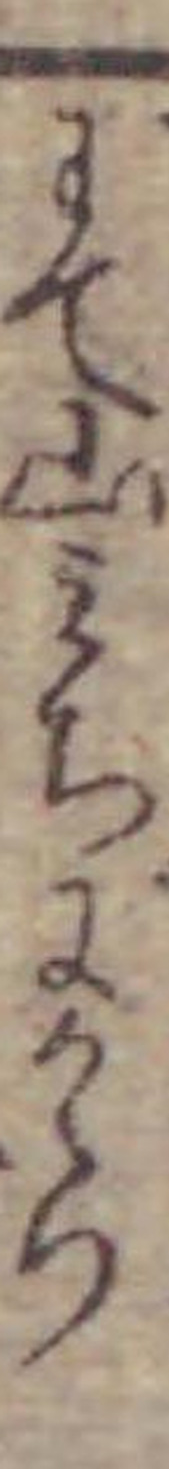にて山みちにかゝり
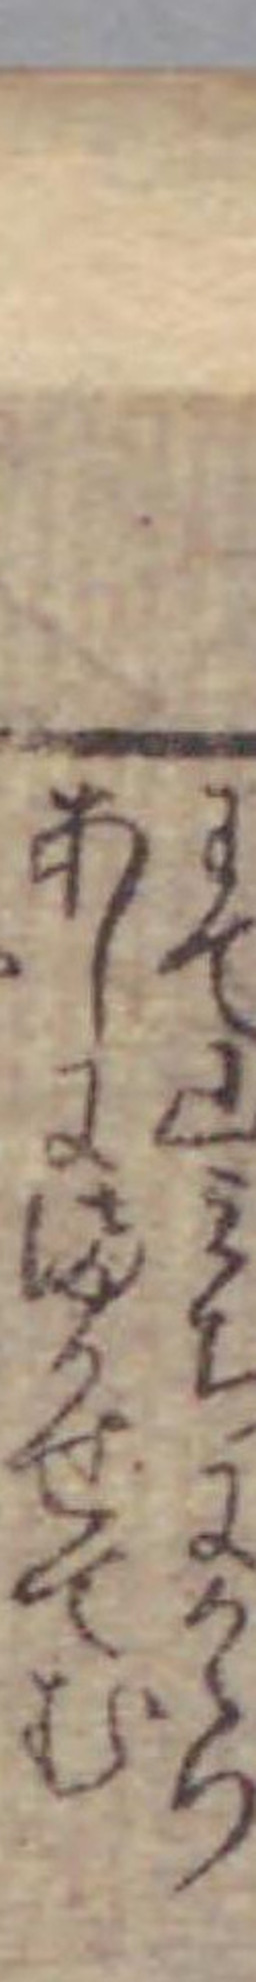あしにまかせてむ
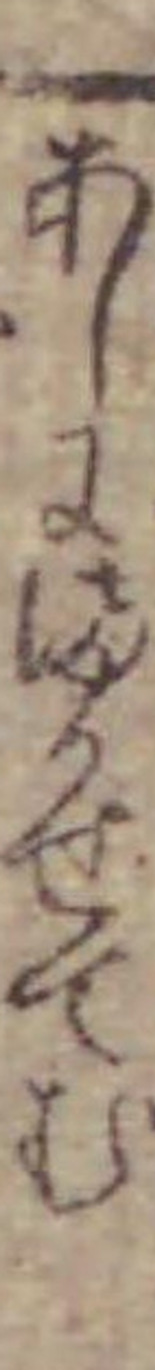あしにまかせてむ
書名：即席耳学問 : 3巻
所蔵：国立国会図書館 National Diet Library, JAPAN
